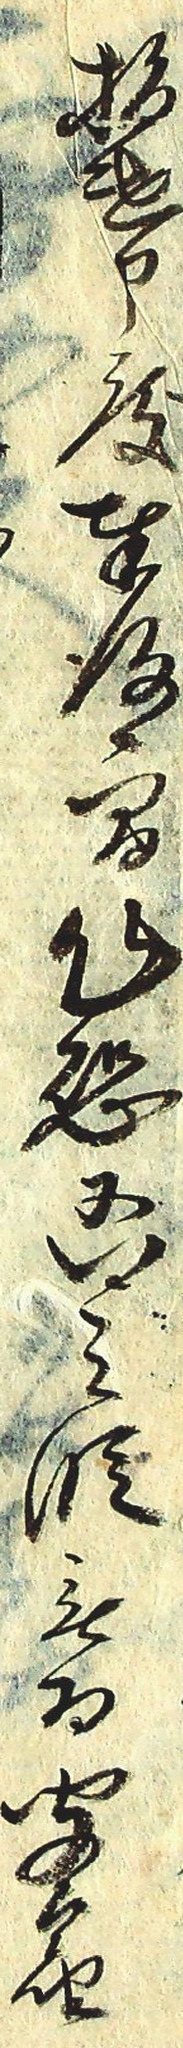指遣申度奉存候間乍恐右之段被為聞召届
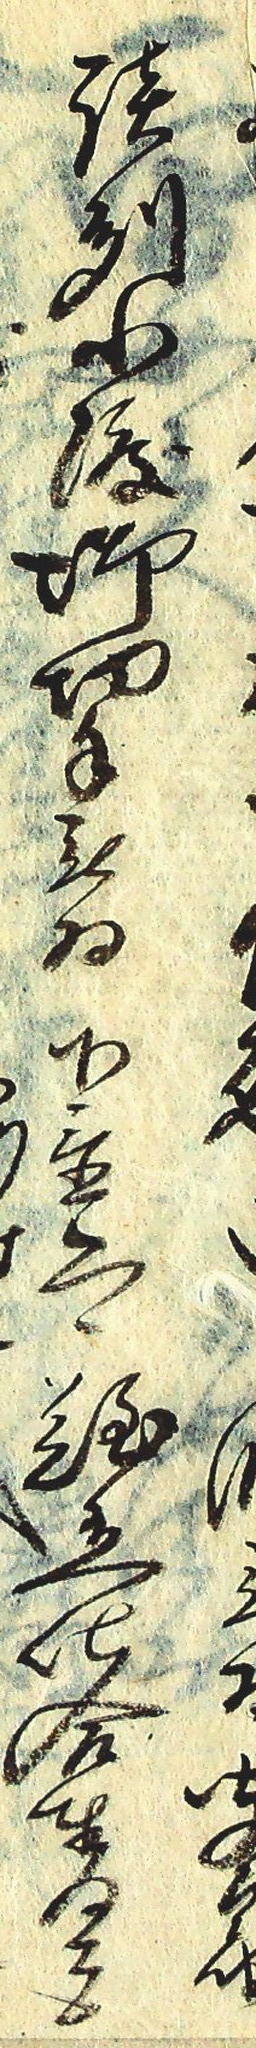淡州小渡御切手被為下置候はゝ難有仕合奉存候以上
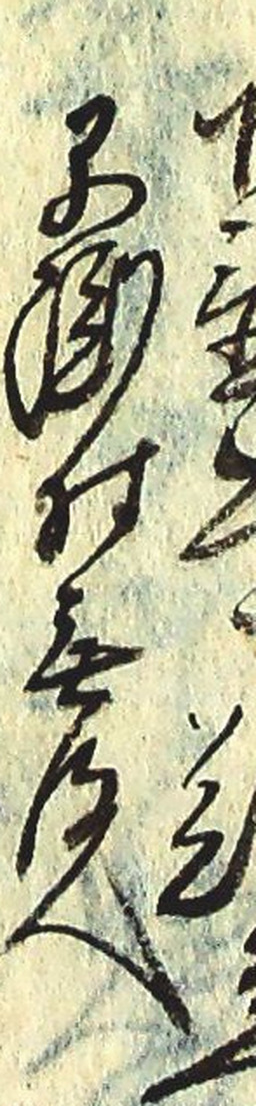早淵村無役人
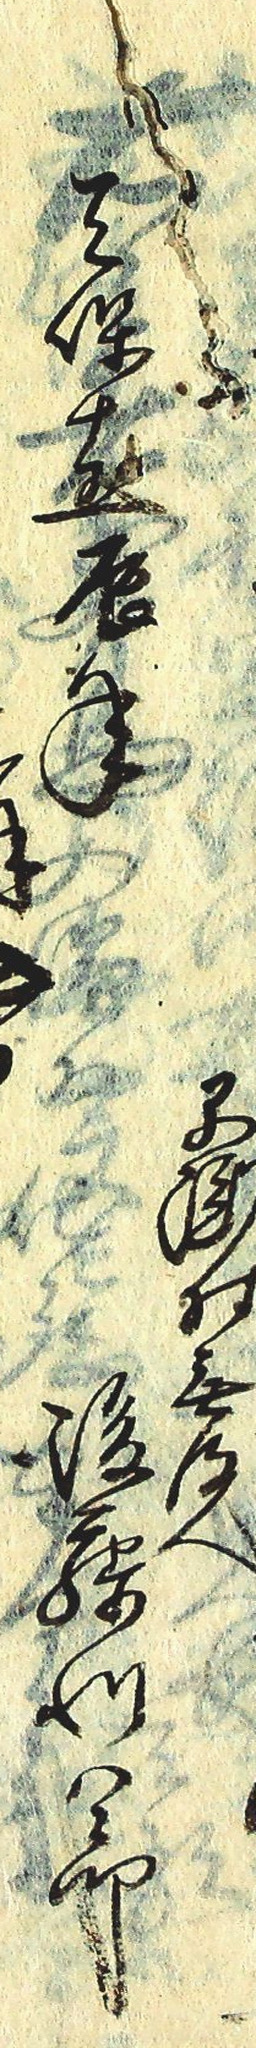天保十五辰年後藤利八郎
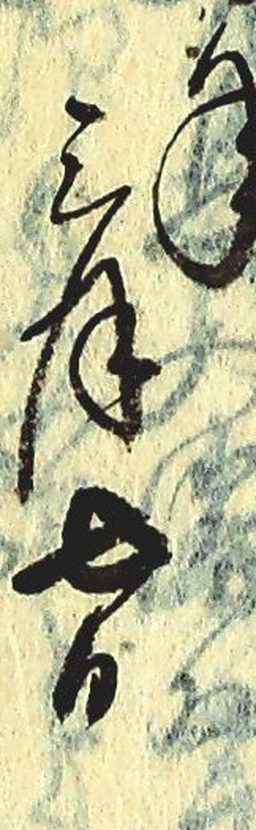三月七日
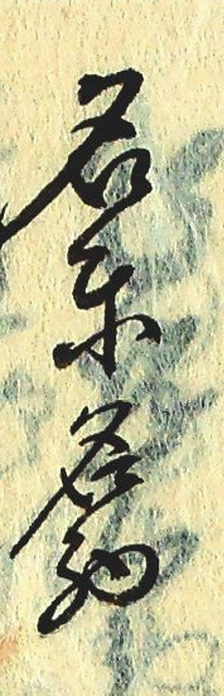名東名西
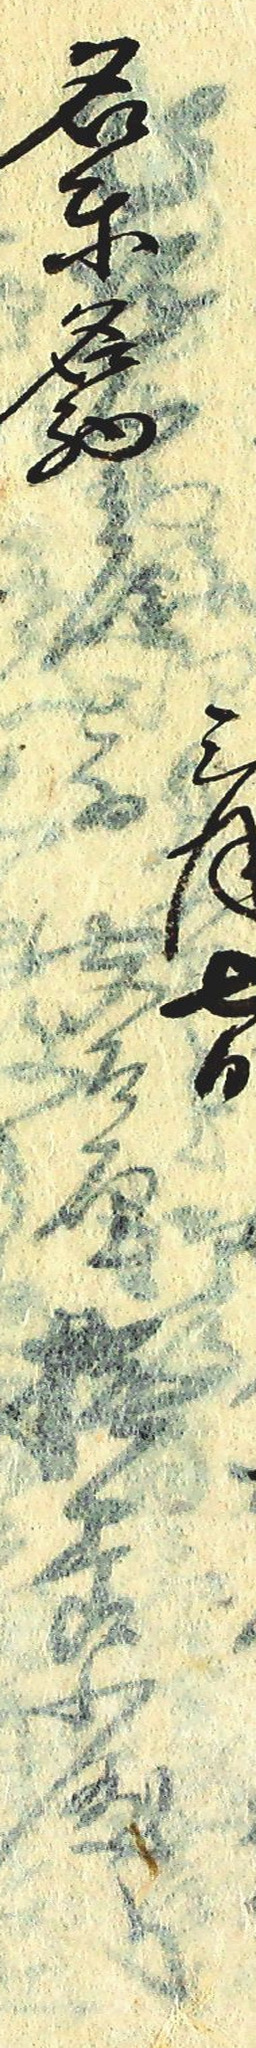名東名西
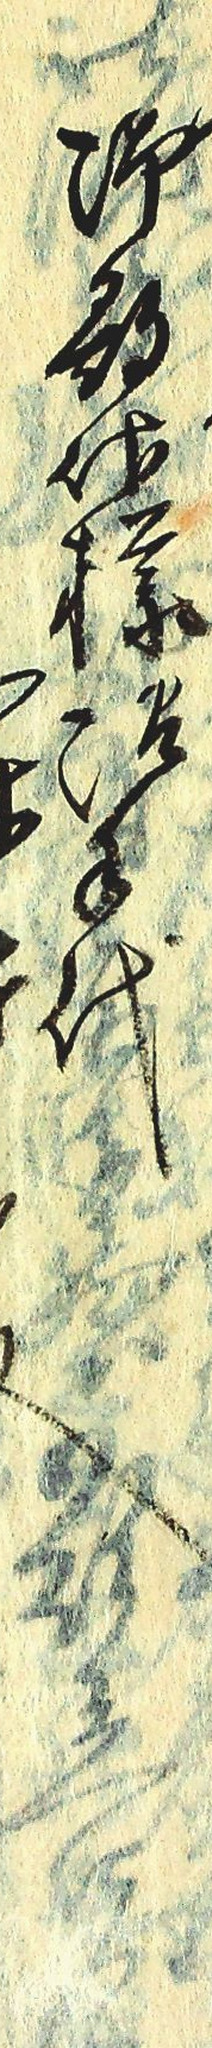御郡代様御手代
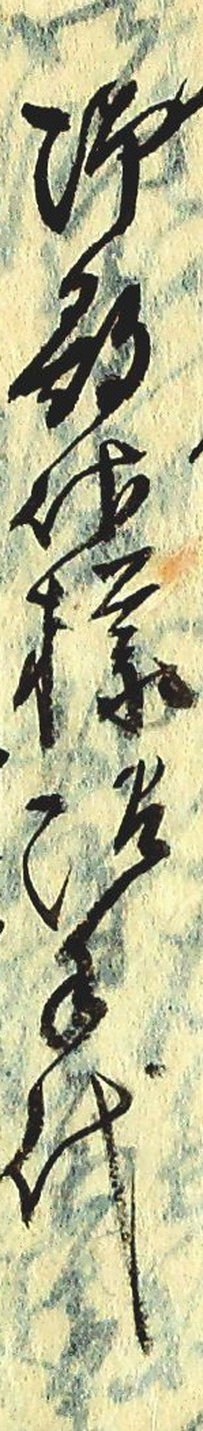御郡代様御手代
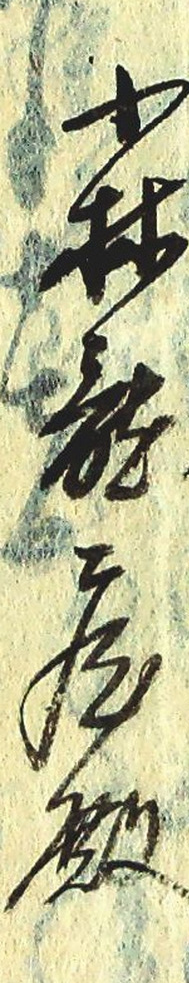小林龍蔵殿
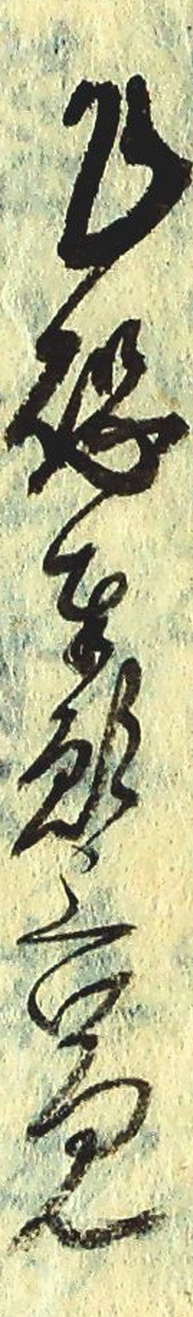乍恐奉願上覚
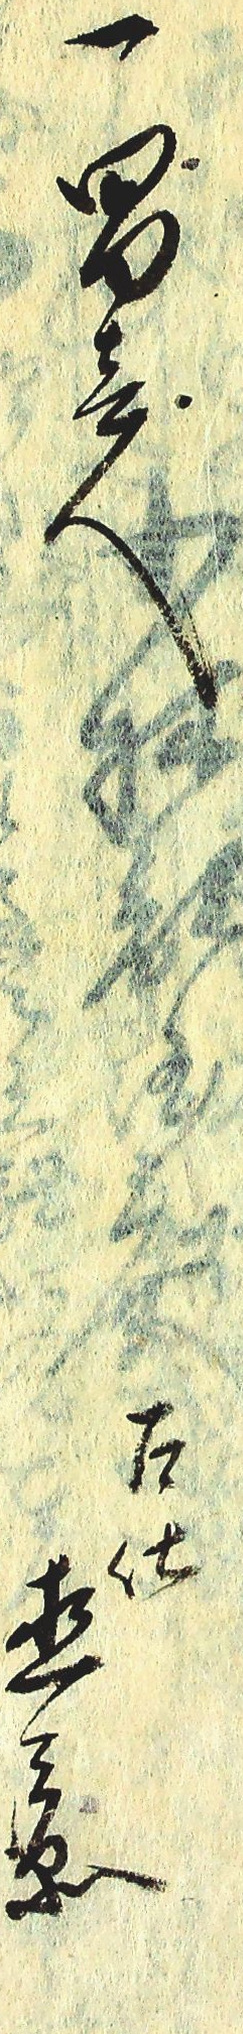一男壱人直兵衛
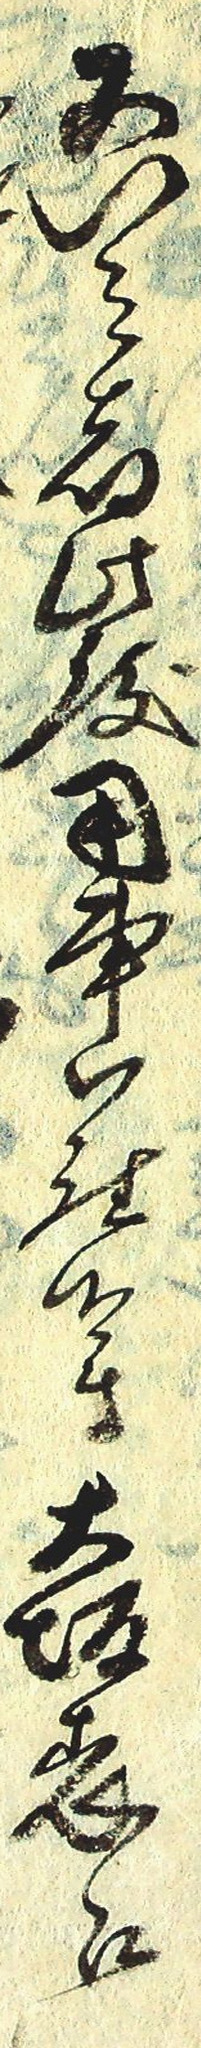右之者此度用事御座候に付大坂表え
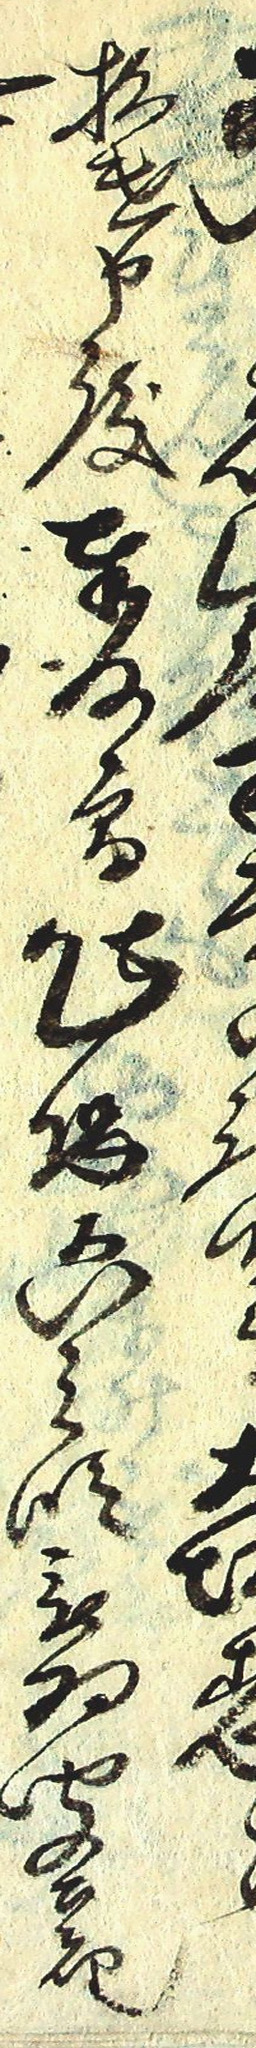指遣申度奉存候間乍恐右之段被為聞召届
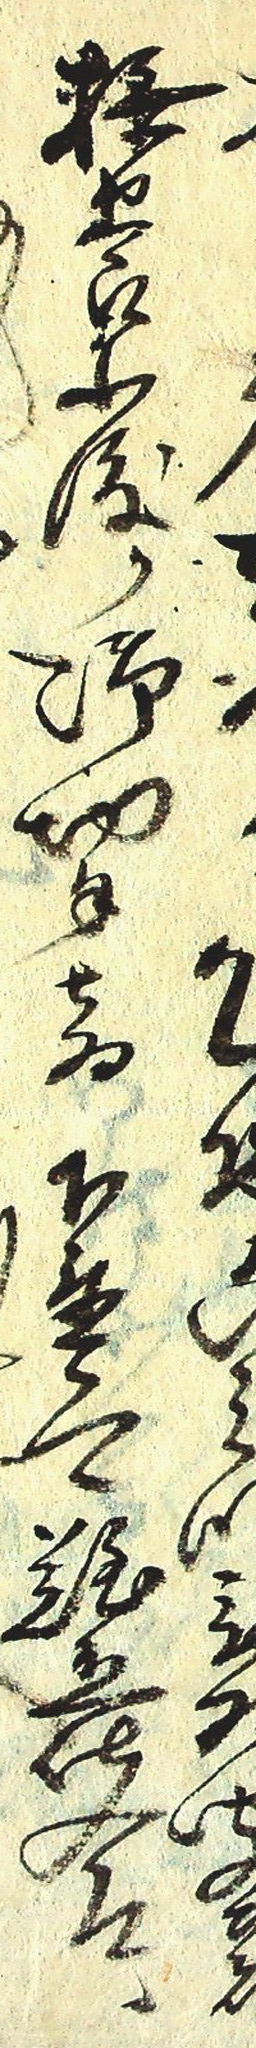撫養小渡り御切手被為下置候はゝ難有仕合に
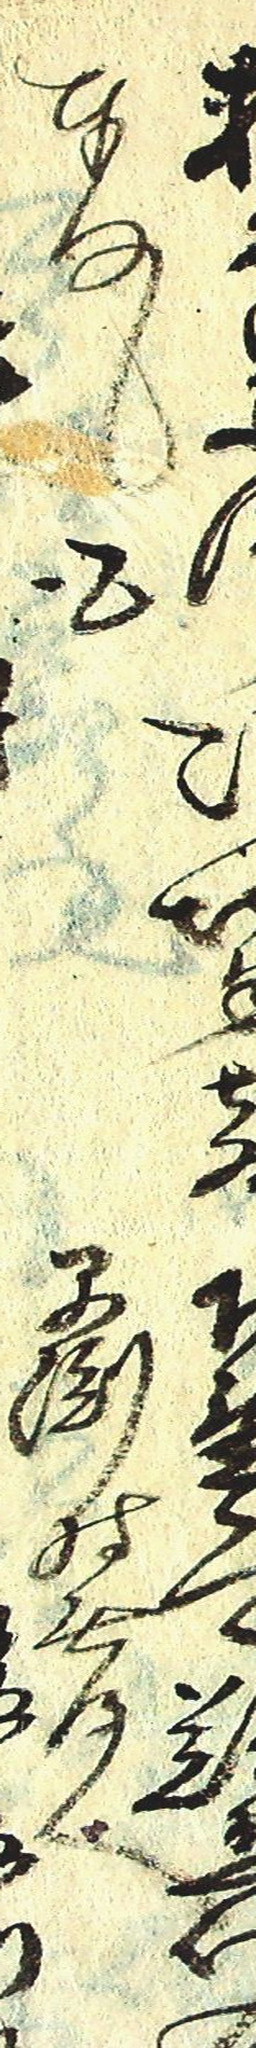奉存候以上早淵村無役人
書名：諸御願書控(弐番）
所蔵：鳴門教育大学 Naruto University of Education
